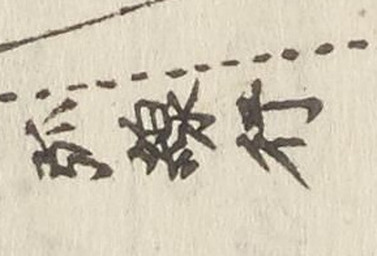弧線行
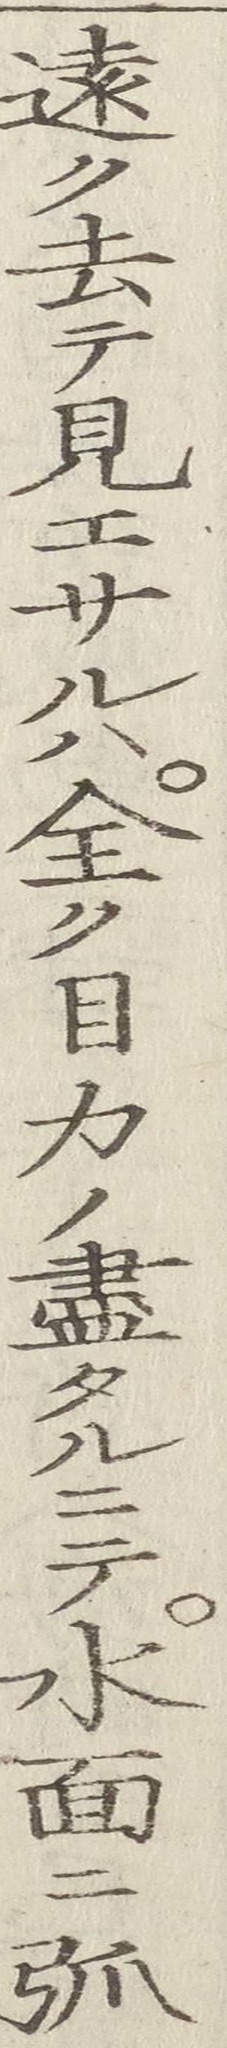遠ク去テ見エサルハ。全ク目力ノ尽タルニテ。水面ニ弧
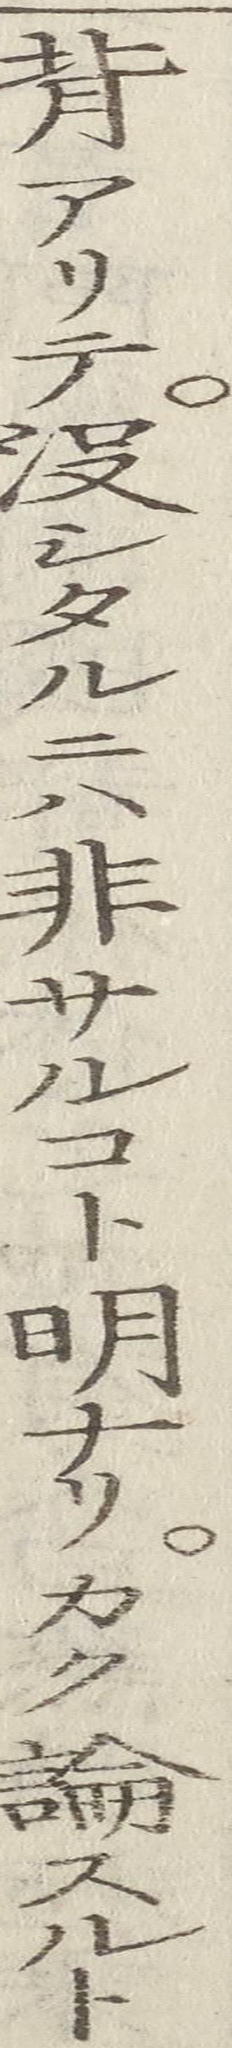背アリテ。没シタルニハ非サルコト明ナリ。カク論スルト
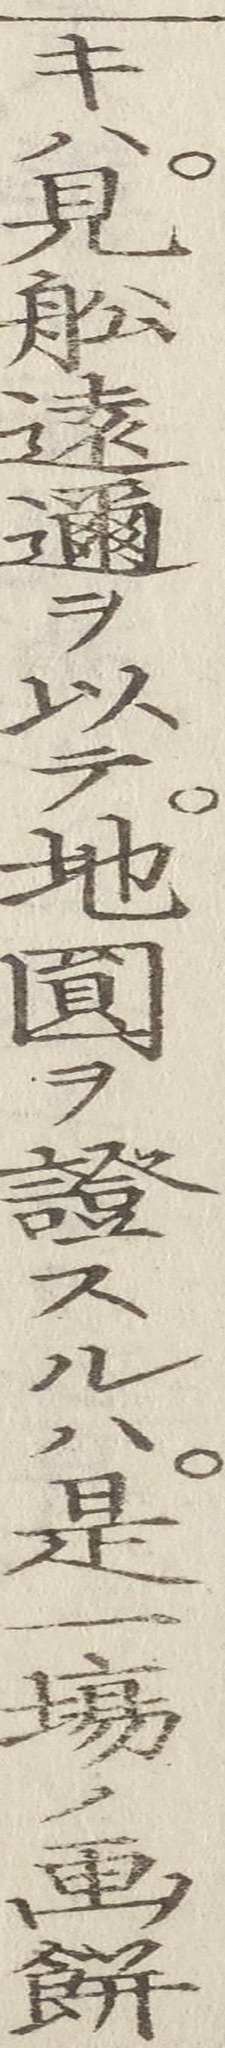キハ。見船遠邇ヲ以テ。地円ヲ証スルハ。是一場ノ画餅
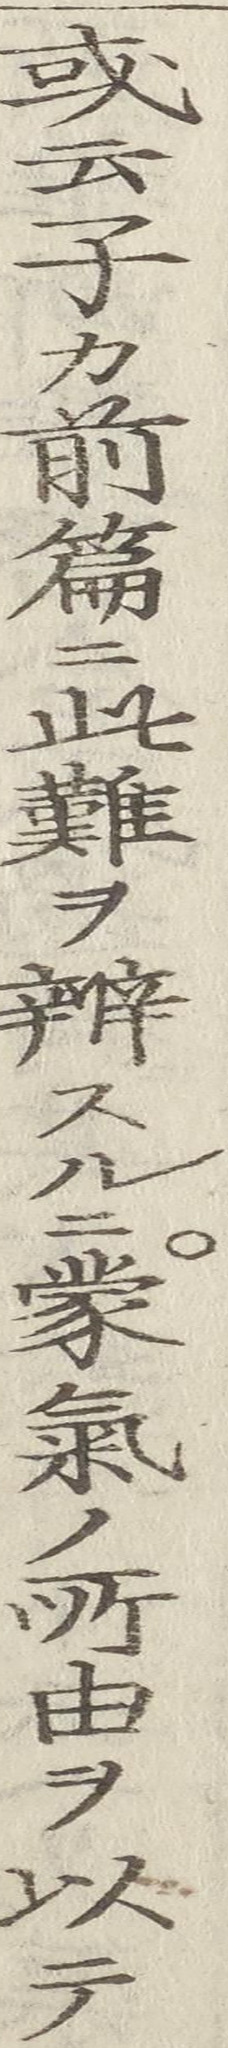或云子カ前篇ニ此難ヲ弁スルニ。蒙気ノ所由ヲ以テ
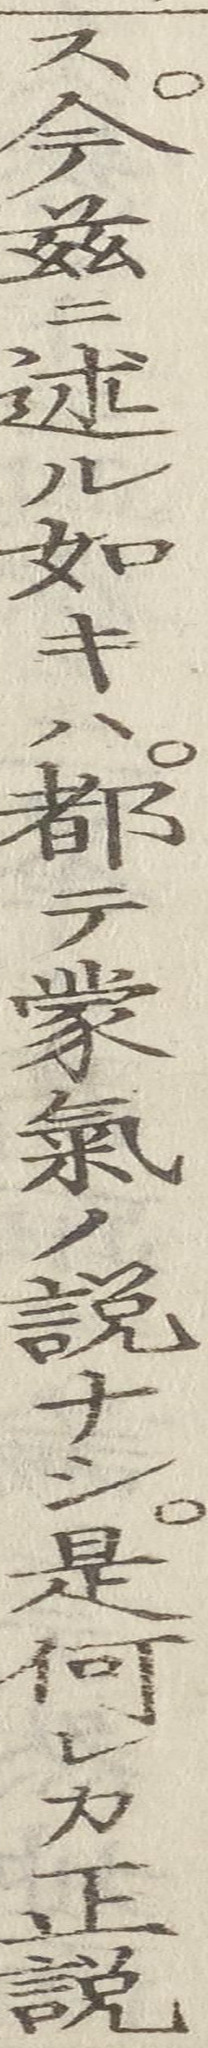ス。今茲ニ述ル如キハ。都テ蒙気ノ説ナシ。是何レカ正説
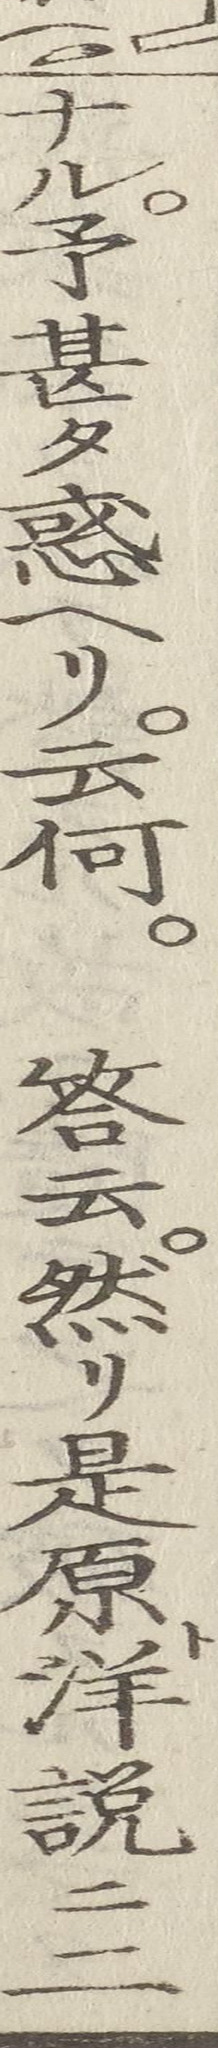ナル。予甚タ惑ヘリ。云何。答云。然リ是原洋説ニニ

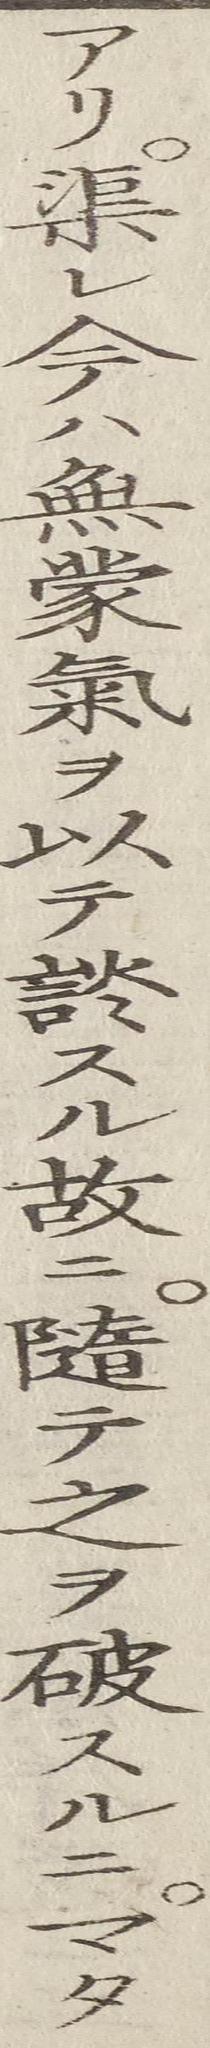アリ。渠レ今ハ無蒙気ヲ以テ談スル故ニ。随テ之ヲ破スルニ。マタ
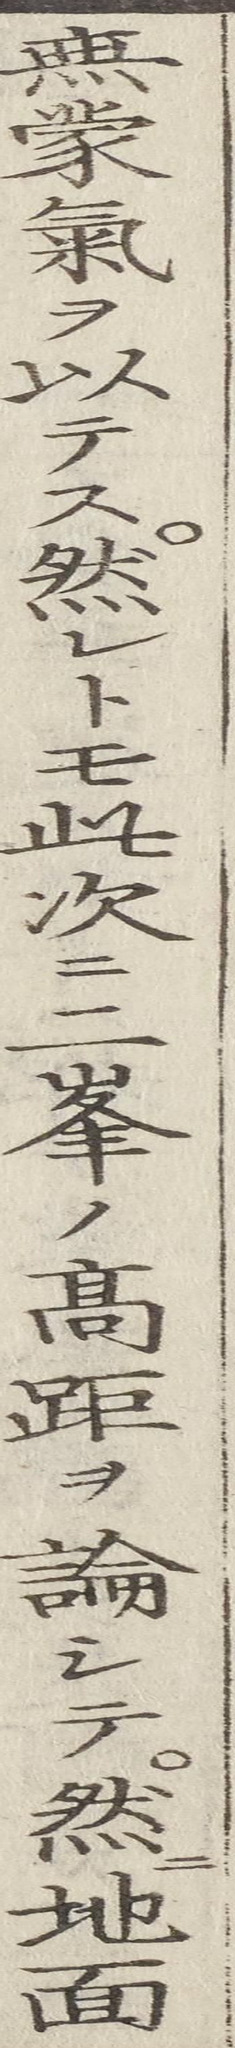無蒙気ヲ以テス。然レトモ此次ニニ峯ノ高距ヲ論シテ。然地面
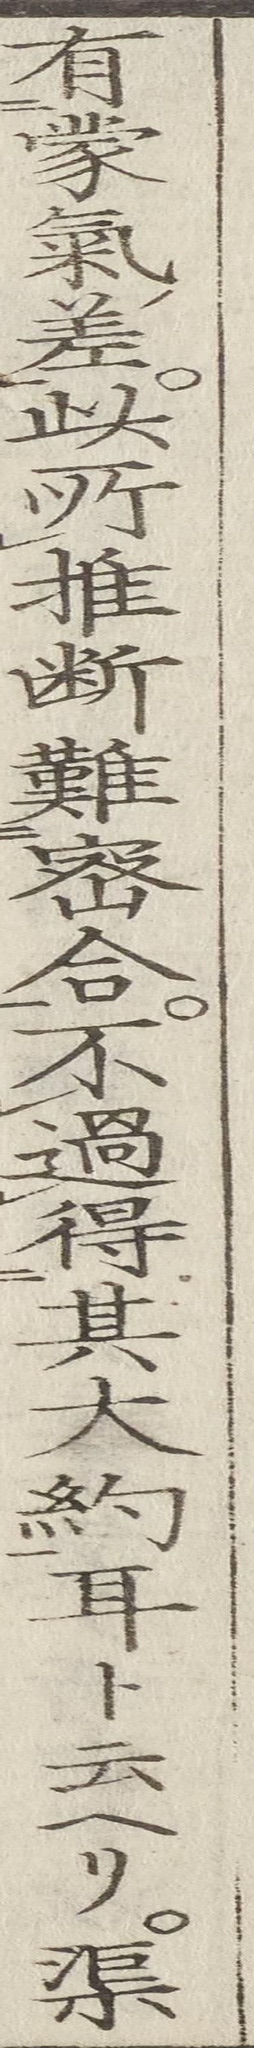有ニ蒙気差。此所推断難ニ密合。不過得ニ其大約耳ト云ヘリ。渠
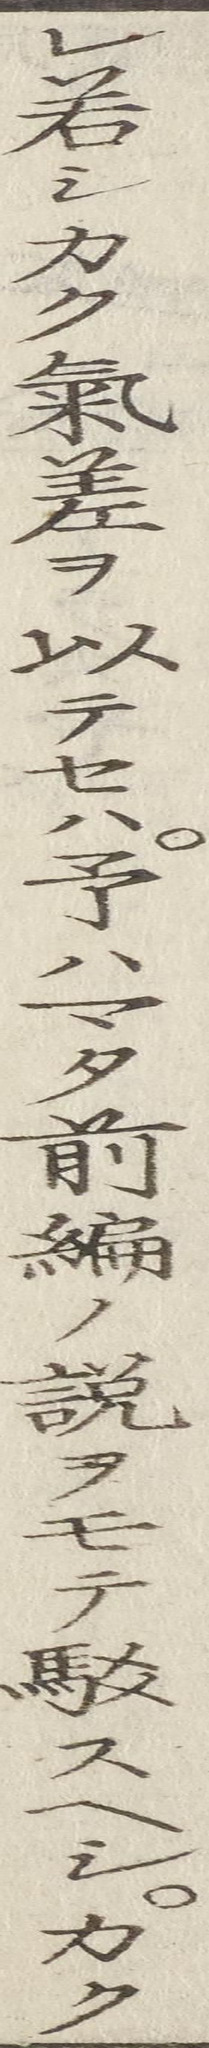レ若シカク気差ヲ以テセハ。予ハマタ前編ノ説ヲモテ駁スヘシ。カク
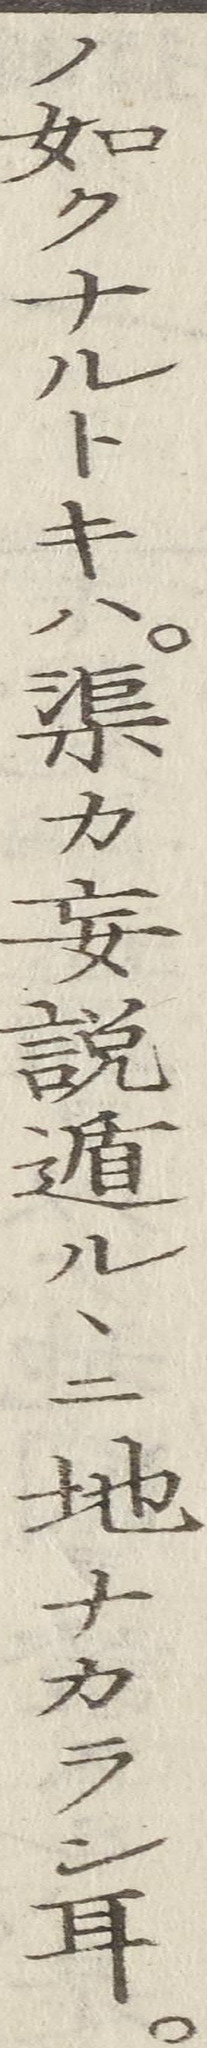ノ如クナルトキハ。渠カ妄説遁ルヽニ地ナカラン耳。
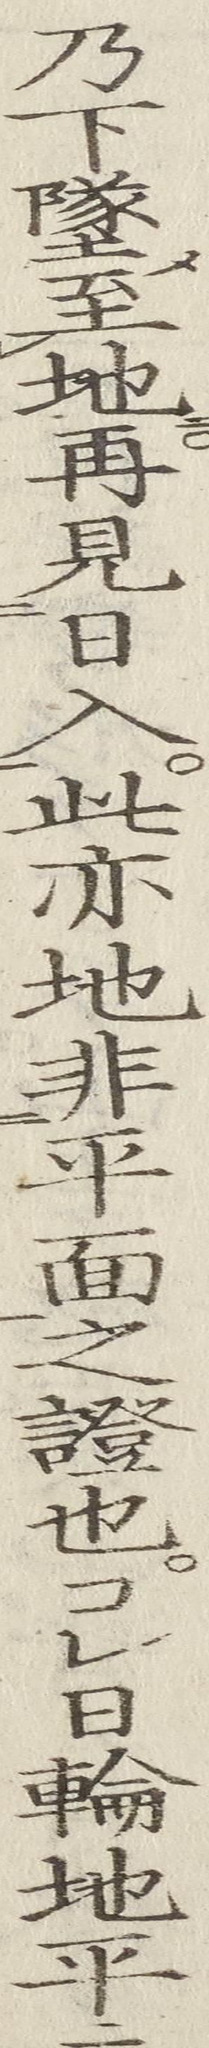乃下墜至地。再見ニ日入。此亦地非ニ平面之証也。コレ日輪地平ニ
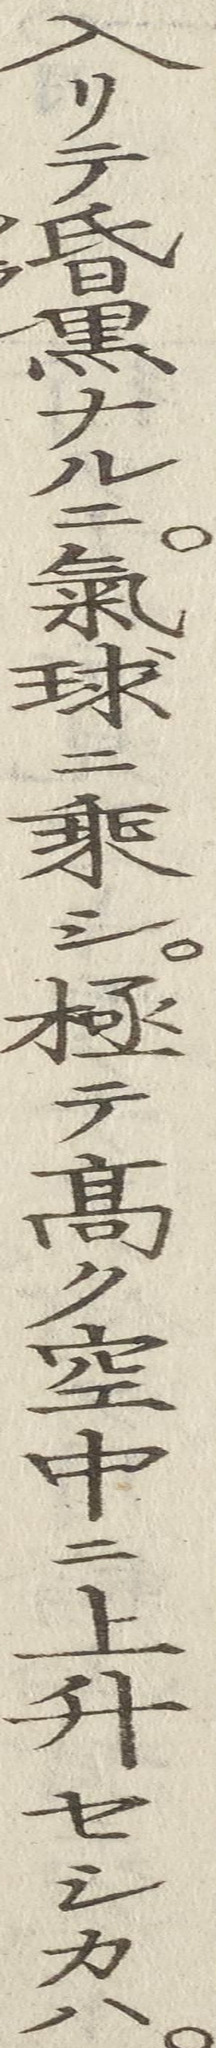入リテ昏黒ナルニ。気球ニ乗シ。極テ高ク空中ニ上升セシカハ。
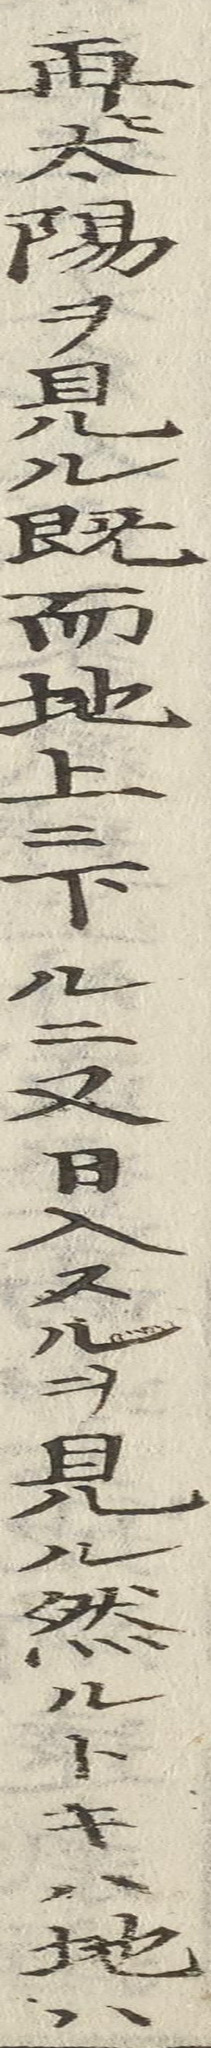再ヒ太陽ヲ見ル既而地上ニ下ルニ又日入スルヲ見ル然ルトキハ地ハ
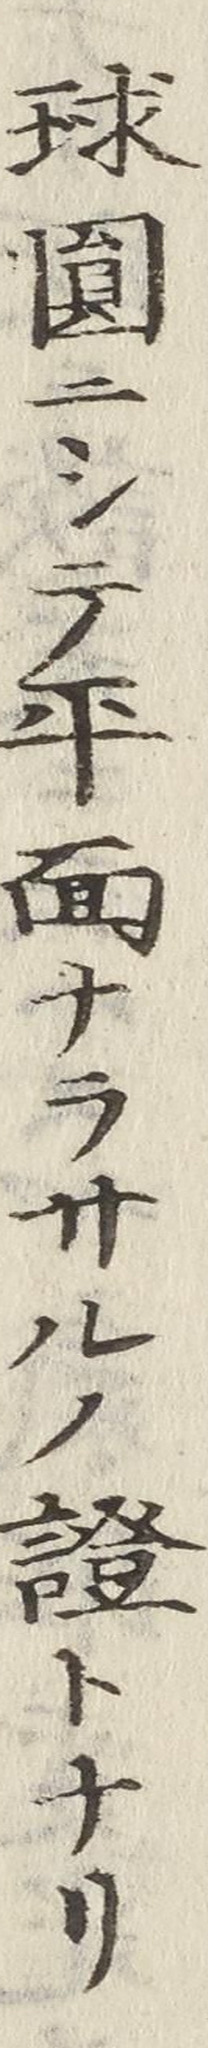球円ニシテ平面ナラサルノ証トナリ
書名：護法新論　二編　下
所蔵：東京大学地震研究所図書室 Earthquake Research Institute Library, The University of Tokyo, JAPAN
